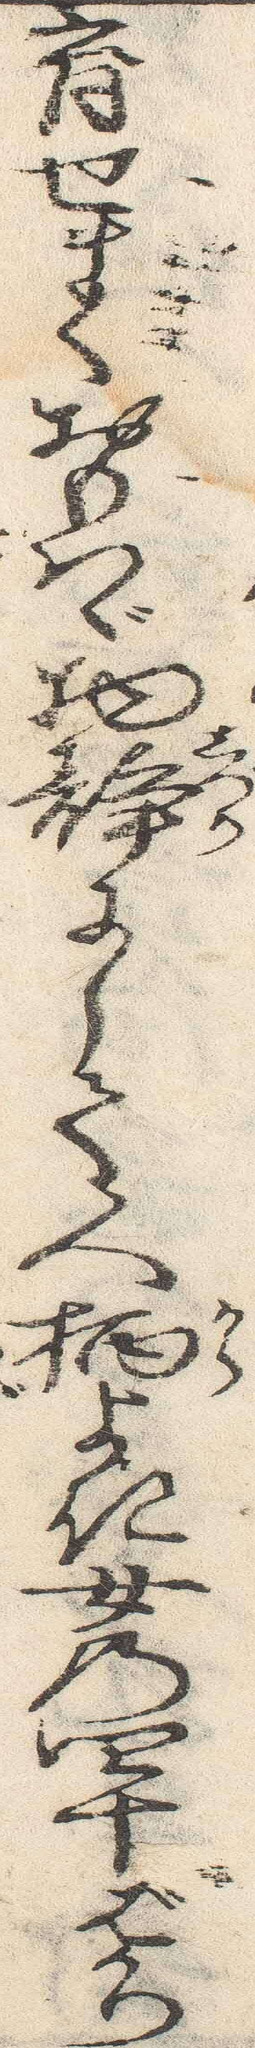育せまくおもはゞ物静にして人柄よき女の四十ばかり
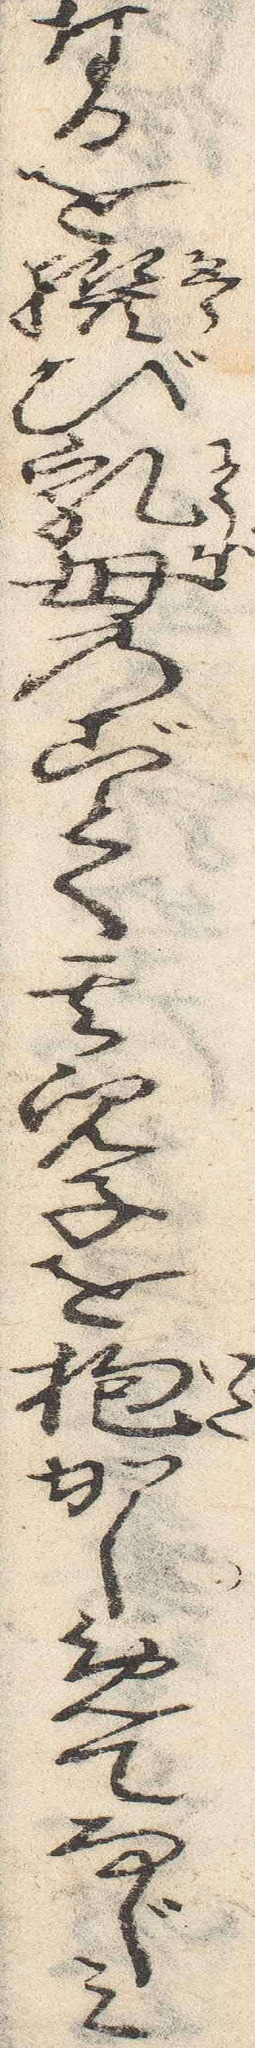なるを撰び乳母のごとく其児子を抱かしめてなじみ
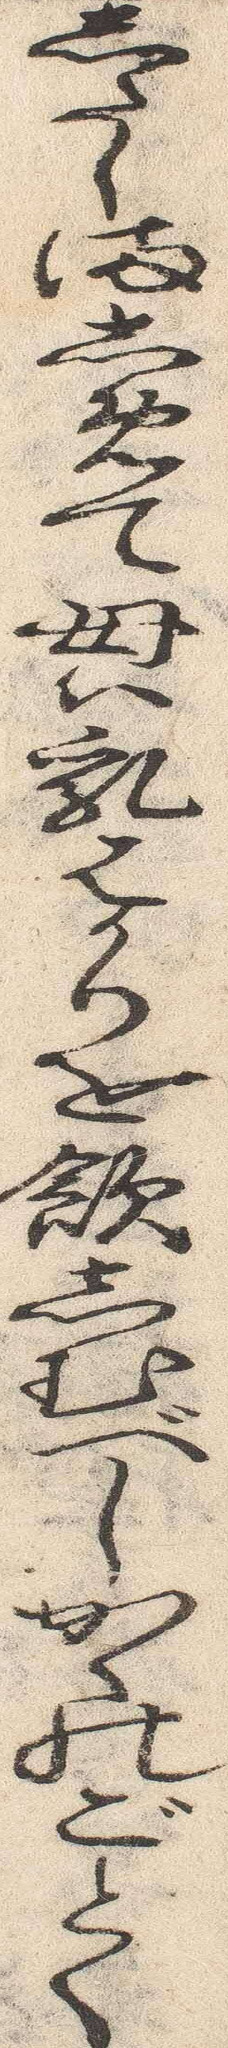したしましめて母は乳はかりを飲しむべしかくのごとく
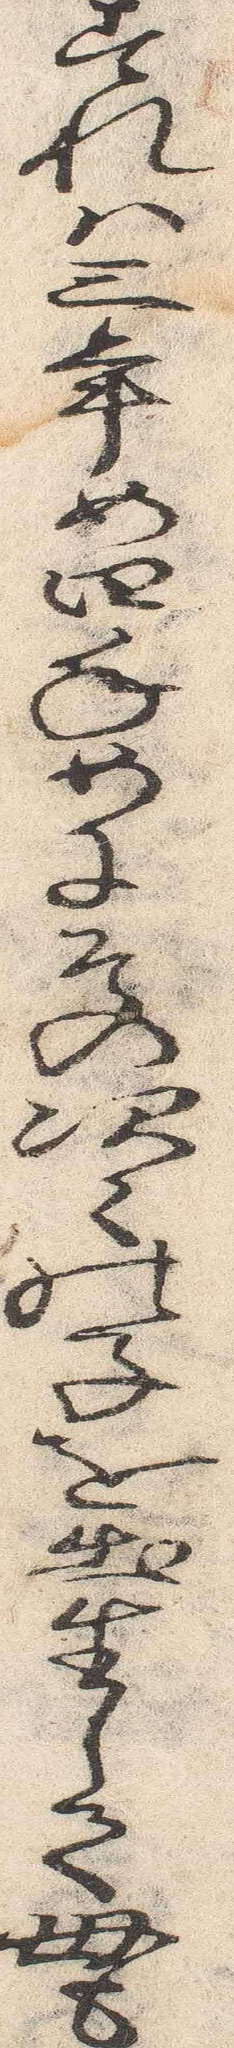すれは三年め四年めにその次〻の子を出生して母も
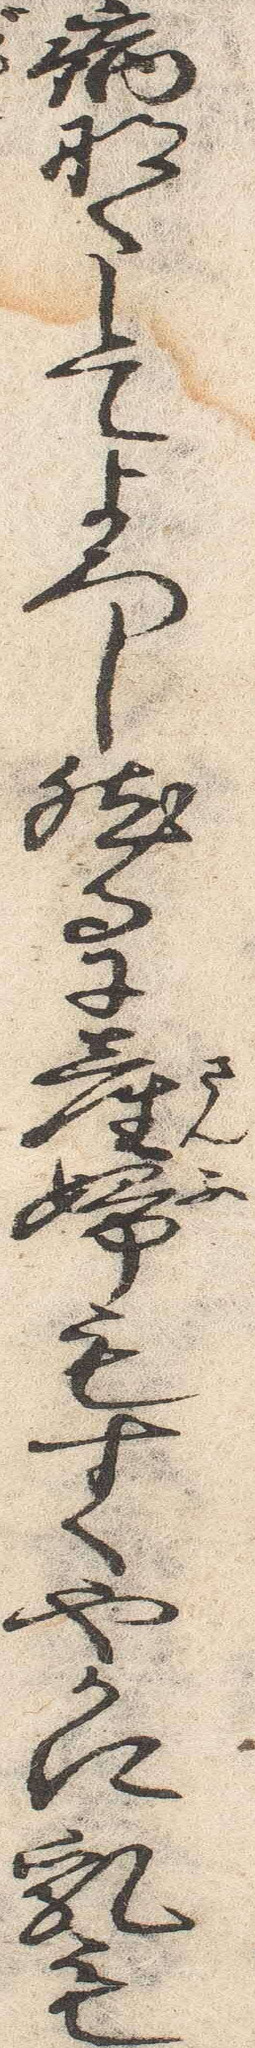病なくしてよろし然るに産婦もすくやかに乳も
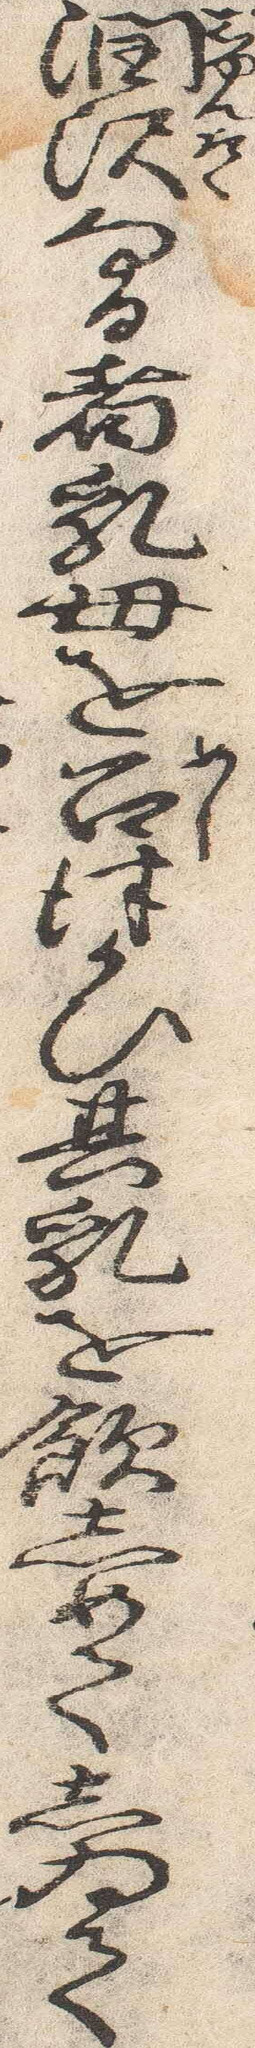潤沢なる者乳母を召つかひ其乳を飲しめてしゐて
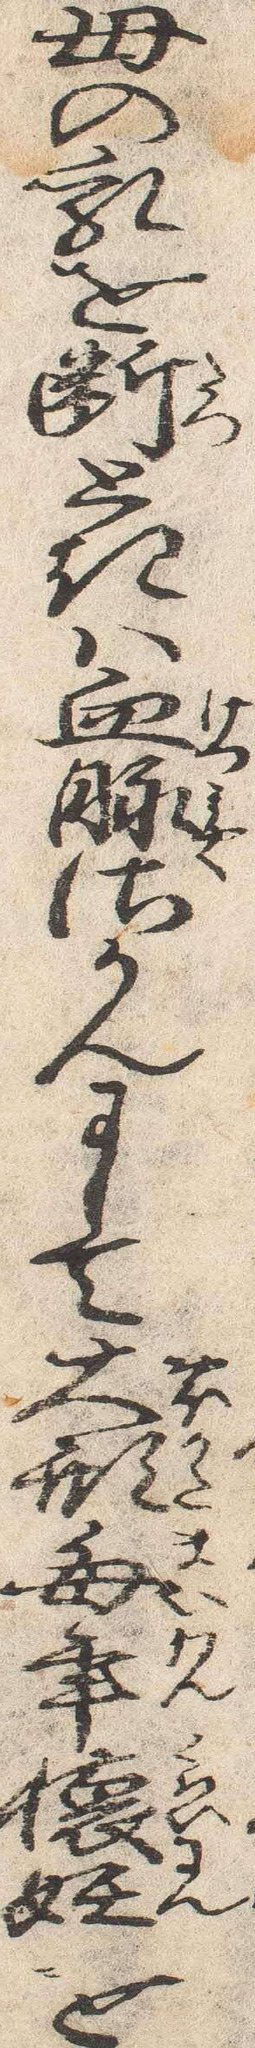母の乳を断ときは血脈さかんにして大形毎年懐妊を
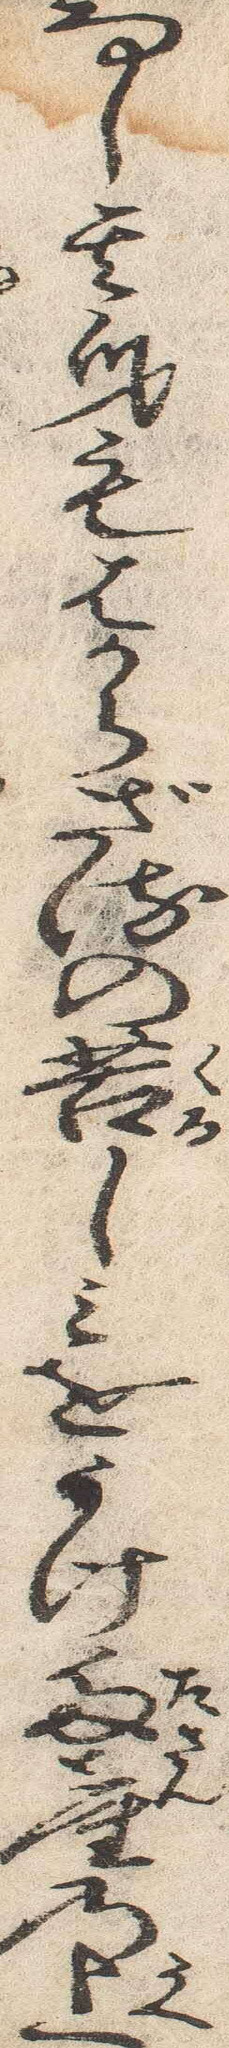なし其身もはからざるの苦しみをうけ多産の上
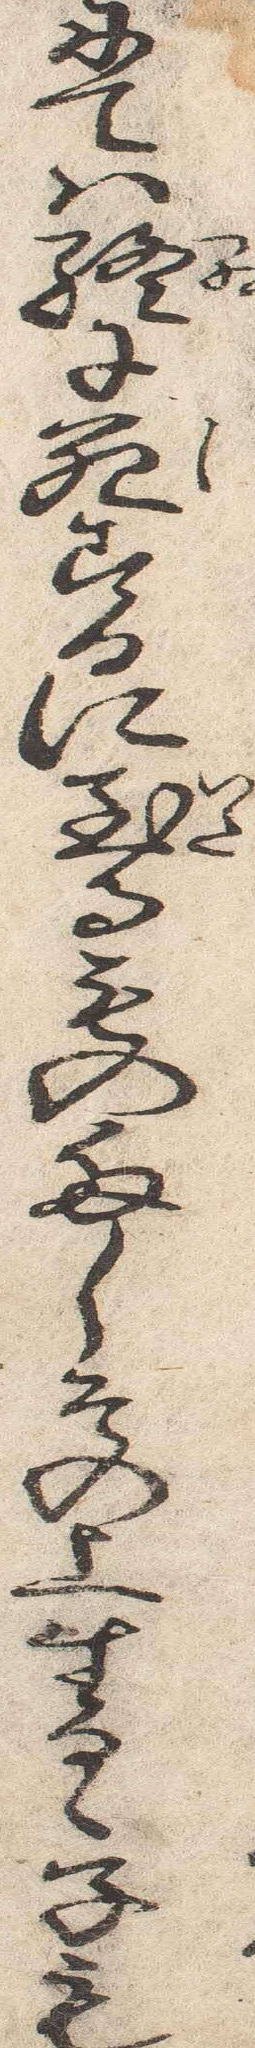にては終に死するに至るもの多しその上生るゝ子も
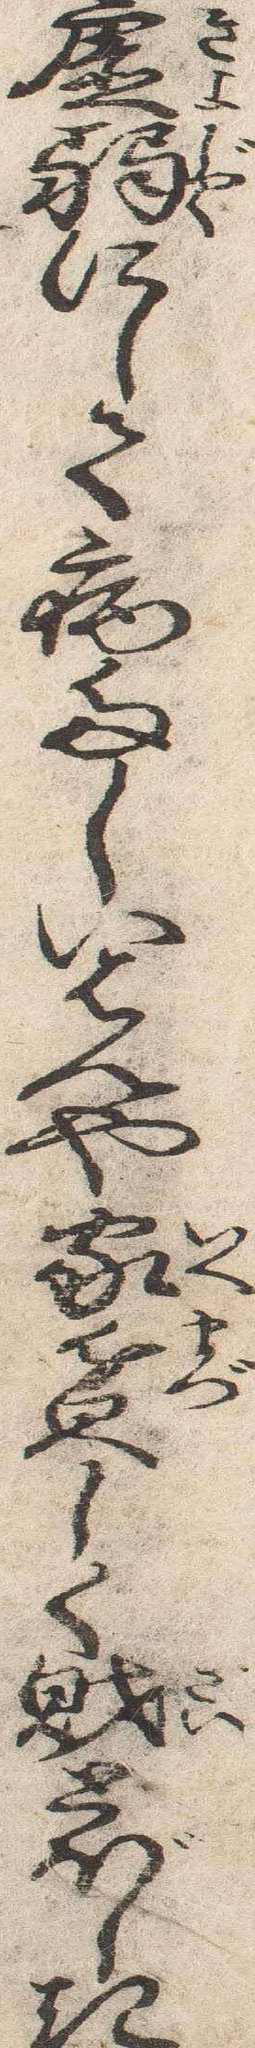虚弱にして病多しいはんや家貧しく財とぼしき
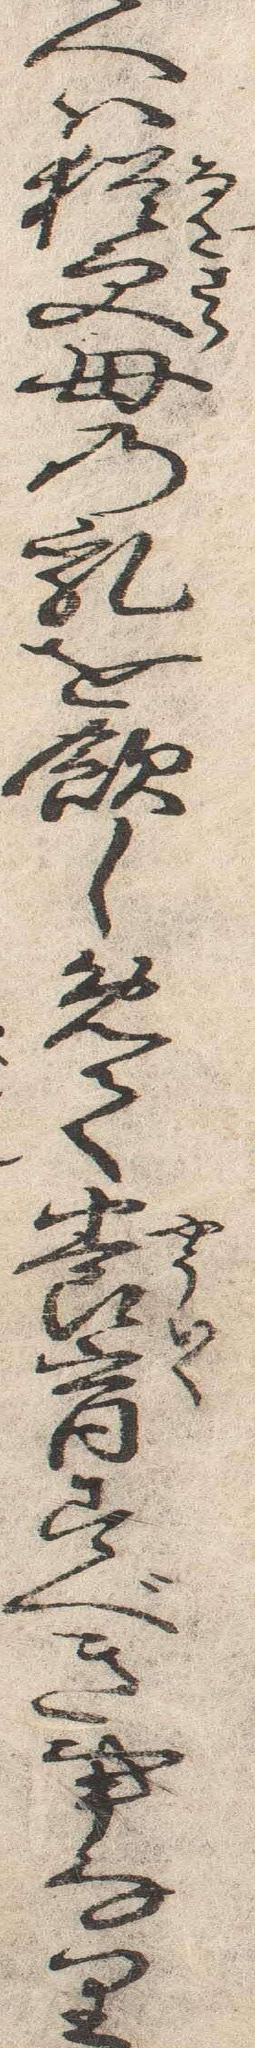人は猶更母の乳を飲しめて養育すべき事なり
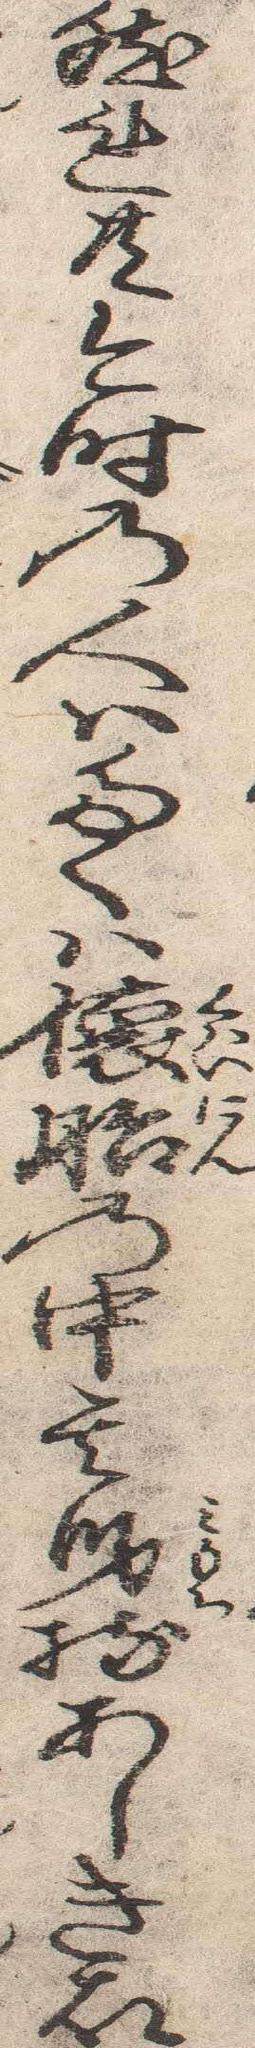然れ共今時の人は多くは懐胎の中其身持あしき故
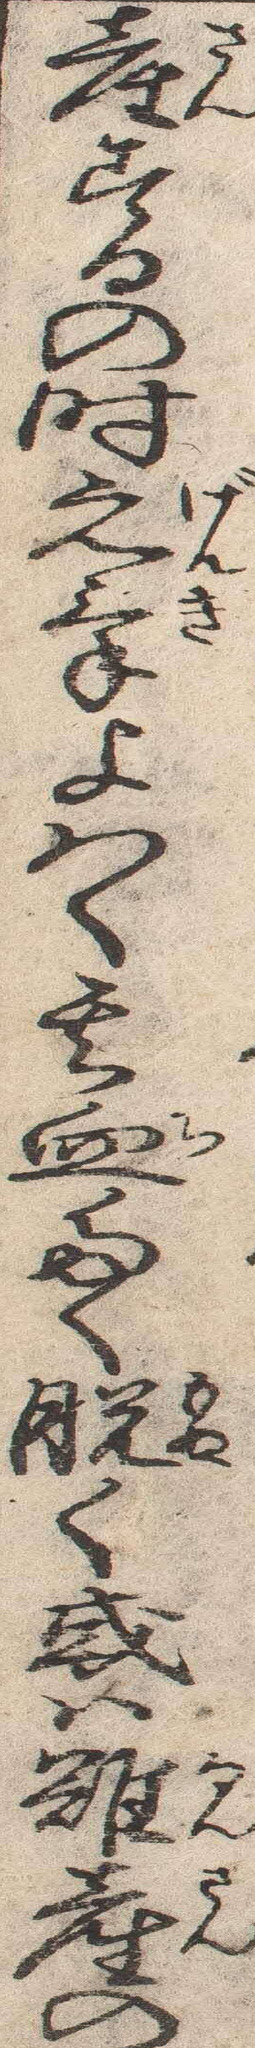産するの時元気よはく其血多く脱く或は難産の

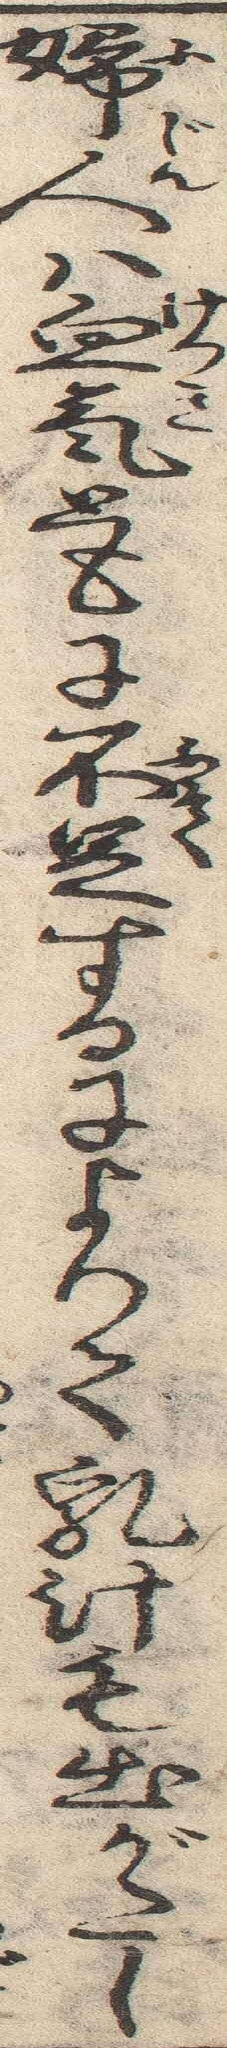婦人は血気ともに不足するによりて乳汁も出がたし
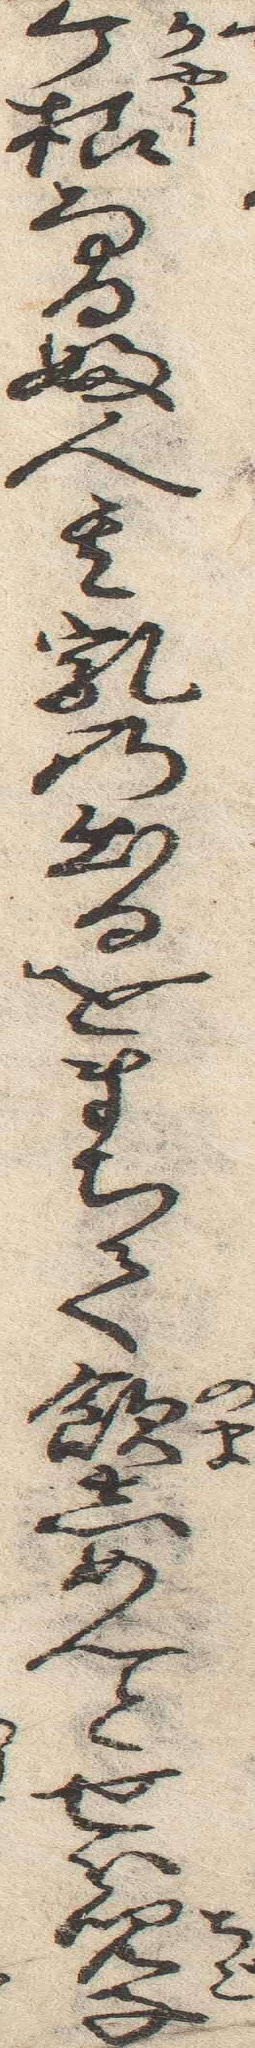ケ様なる婦人其乳の出るをまちて飲しめんとせは児子
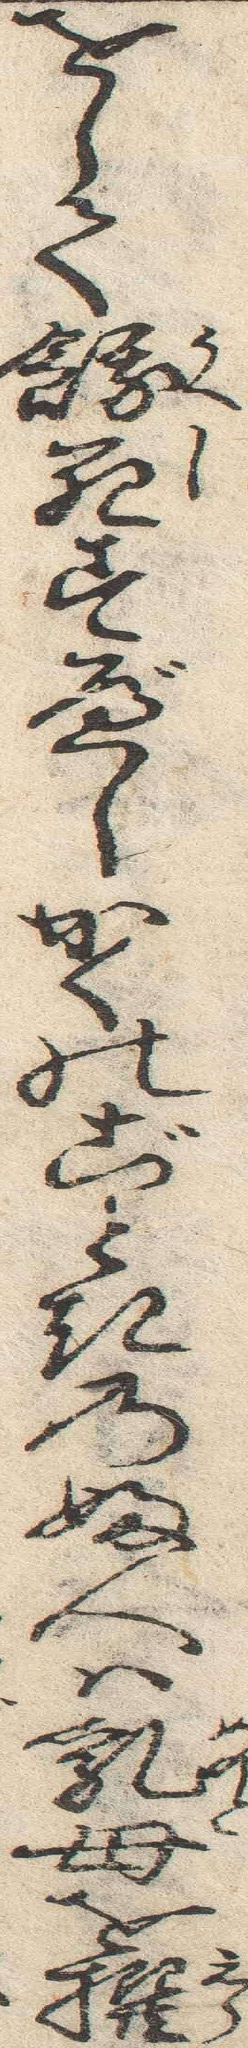をして餓死すべしかくのごときの婦人は乳母を撰
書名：小児必用養育草
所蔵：東京学芸大学附属図書館 国文学研究資料館
